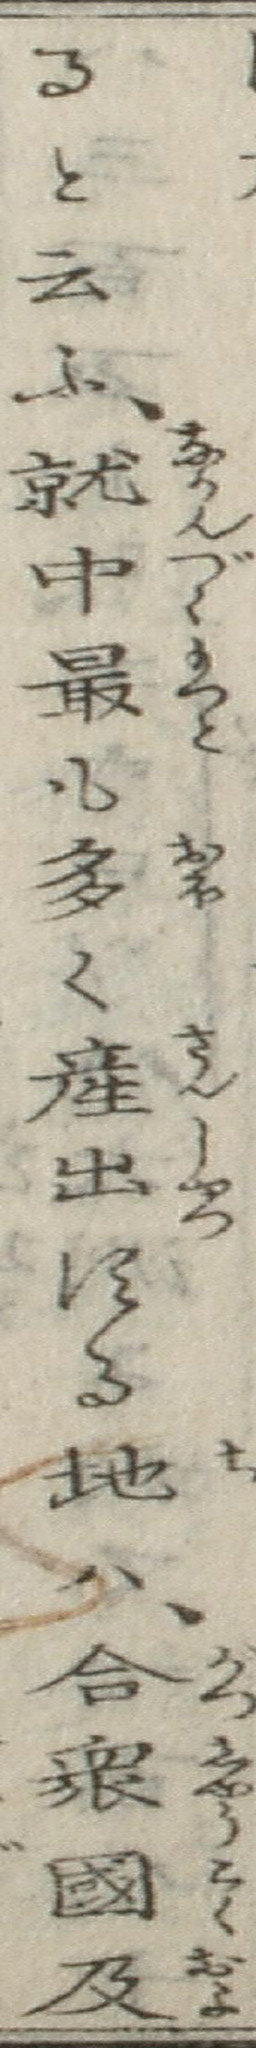ると云ふ、就中最も多く産出する地は、合衆國及
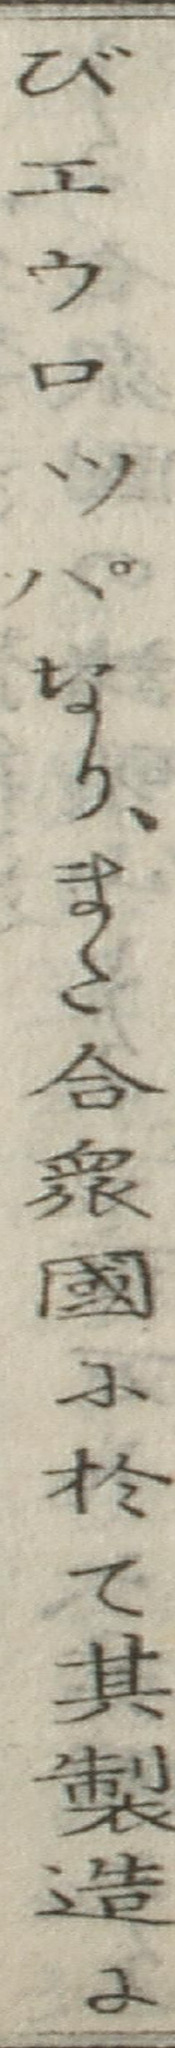びエウロツパなり、また合衆國に於て其製造に
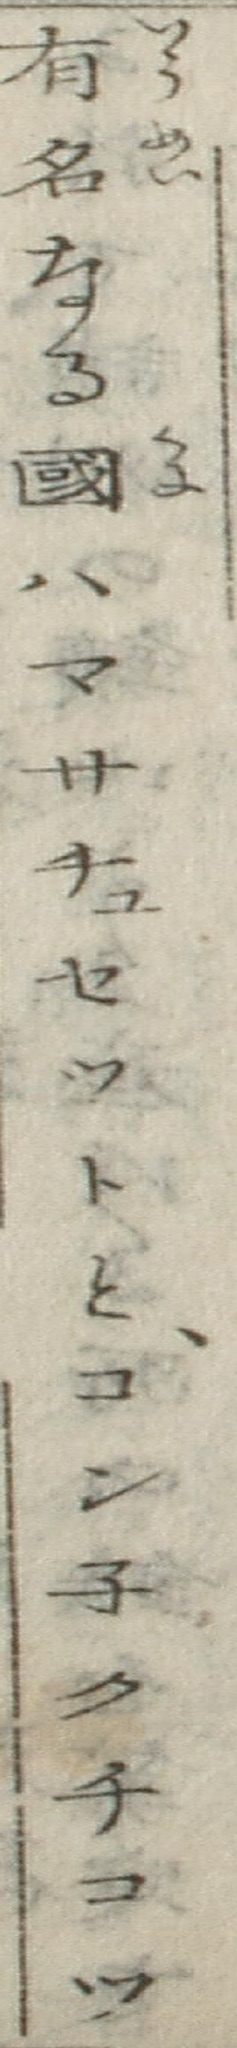有名なる國はマサチュセツトと、コンネクチコツ
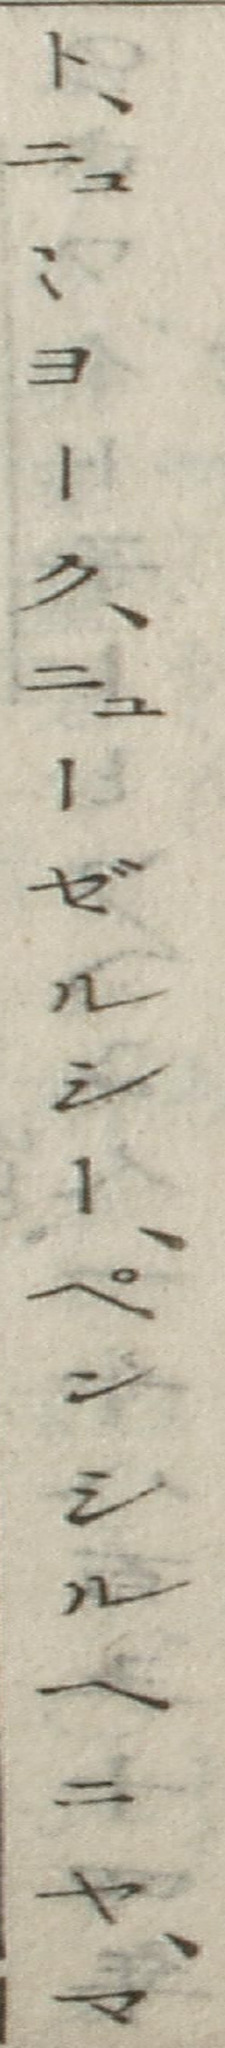ト、ニュ〻ヨーク、ニューゼルシー、ペンシルヘニヤ、マ
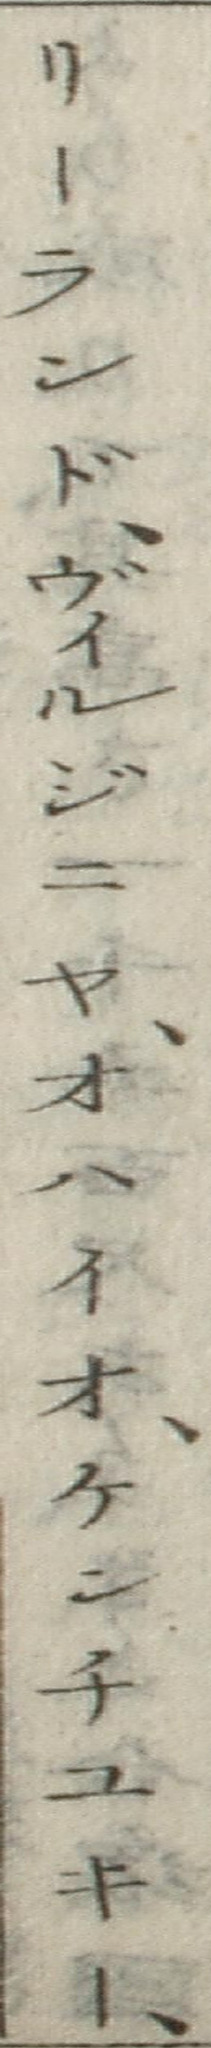リーランド、ヴイルジニヤ、オハイオ、ケンチユキー、
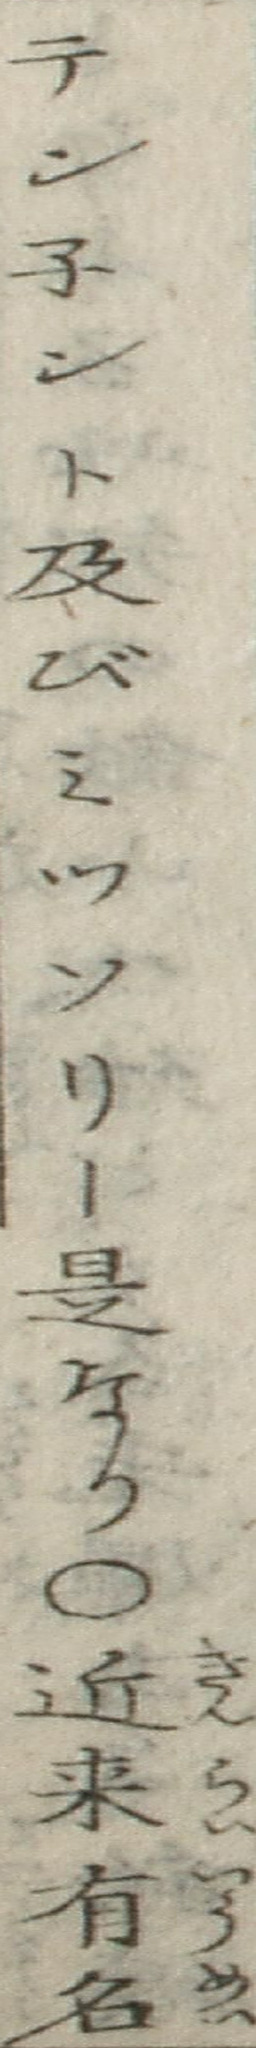テンネント及びミツソリー是なり○近来有名

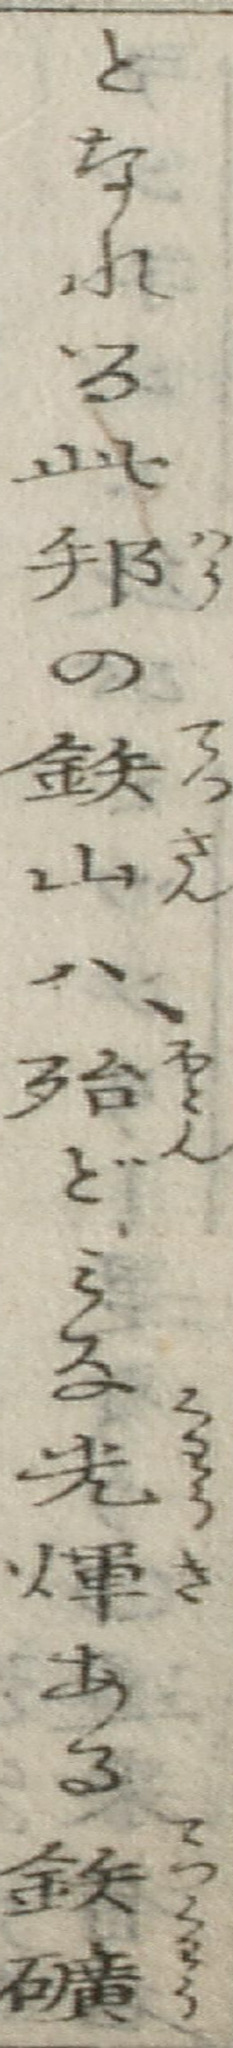となれる此邦の鉄山は、殆ど光煇ある鉄砿
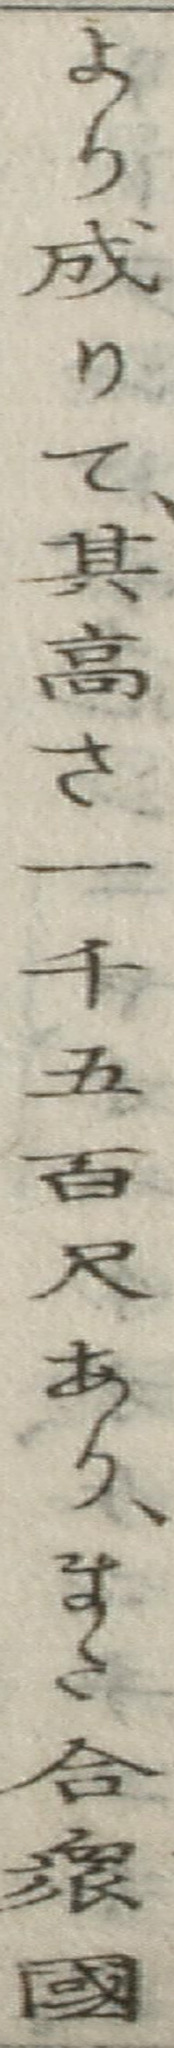より成りて、其高さ一千五百尺あり、また合衆国
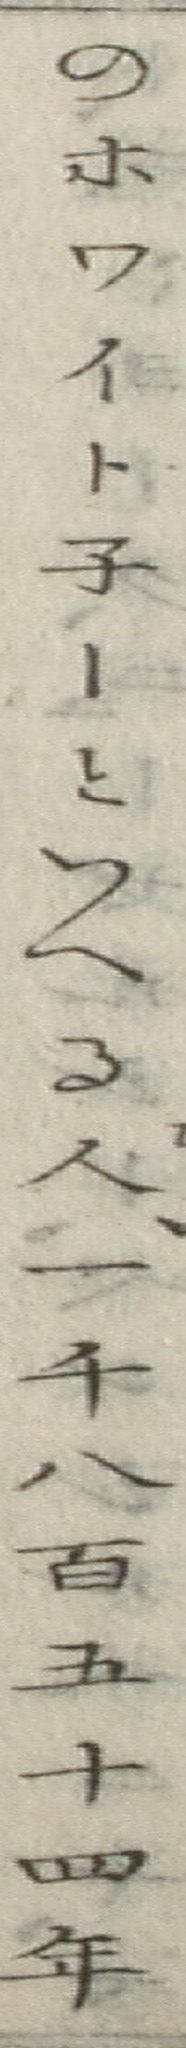のホワイトネーといへる人、一千八百五十四年
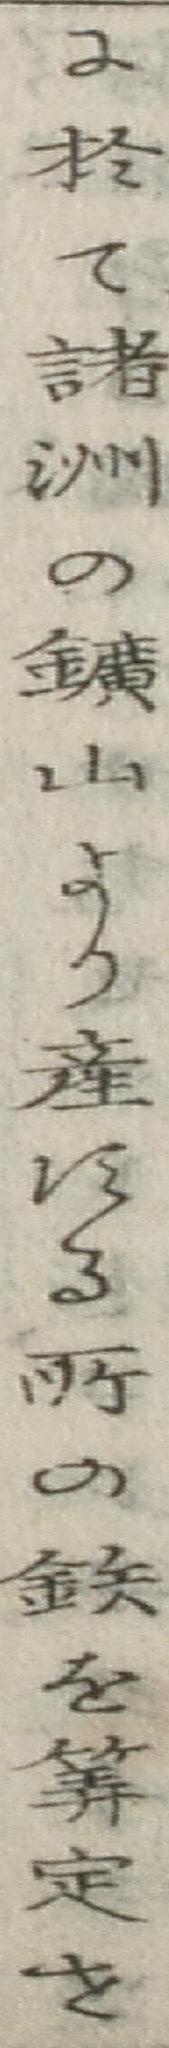に於て、諸州の鉱山より産する所の鉄を算定せ
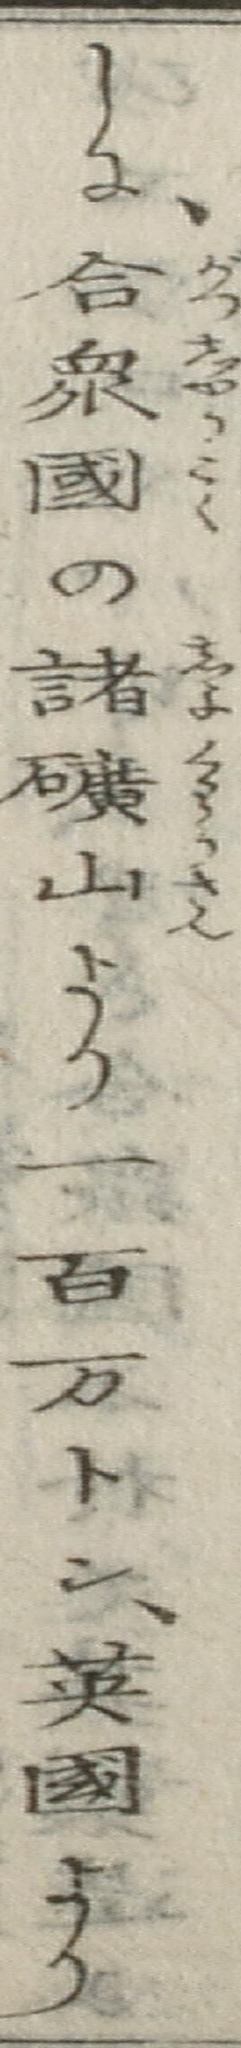しに、合衆国の諸砿山より一百万トン、英國より
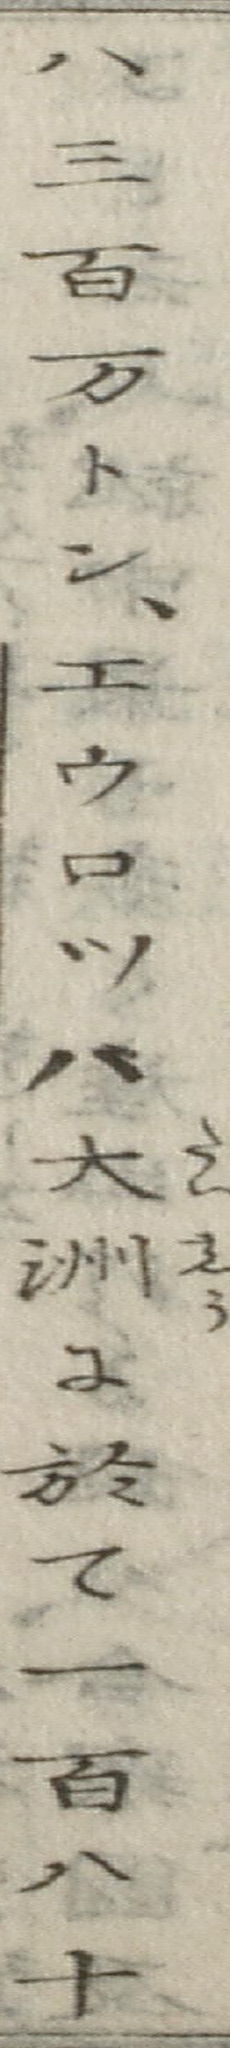は三百万トン、エウロツパ大洲に於て一百八十
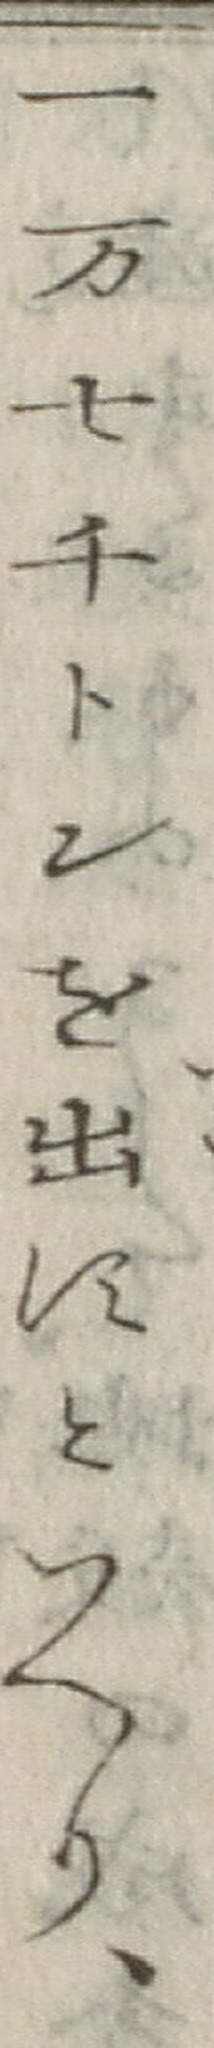一万七千トンと出すといへり、
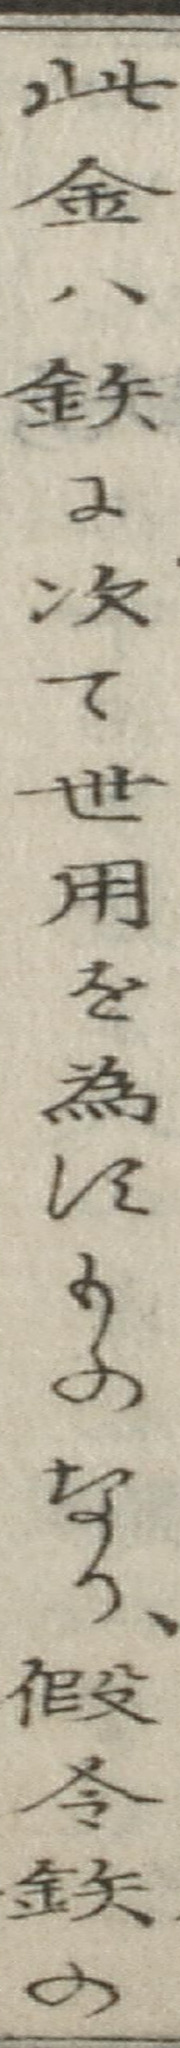此金は鉄に次て世用を為すものなり、假今鉄の
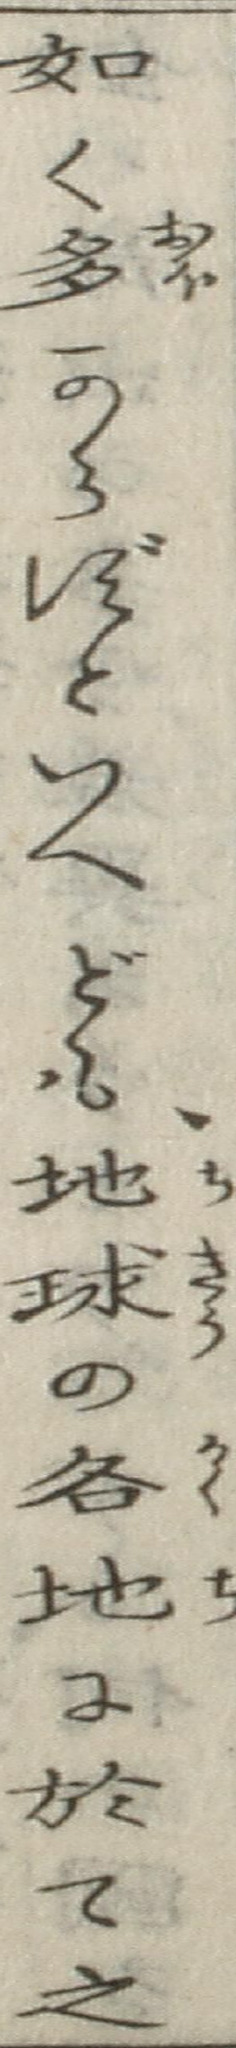如く多からずといへども、地球の各地に於て之
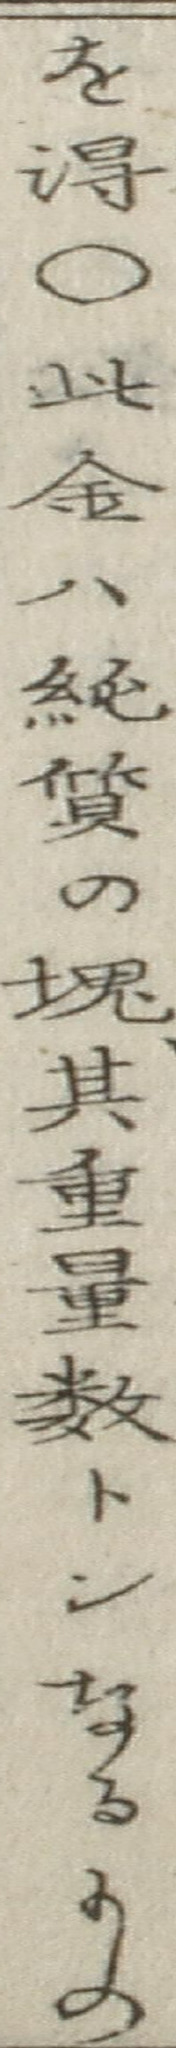を得○此金は純質の塊、其重量数トンなるもの
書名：訓蒙　天然地理學　下
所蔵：東京大学地震研究所図書室 Earthquake Research Institute Library, The University of Tokyo, JAPAN
